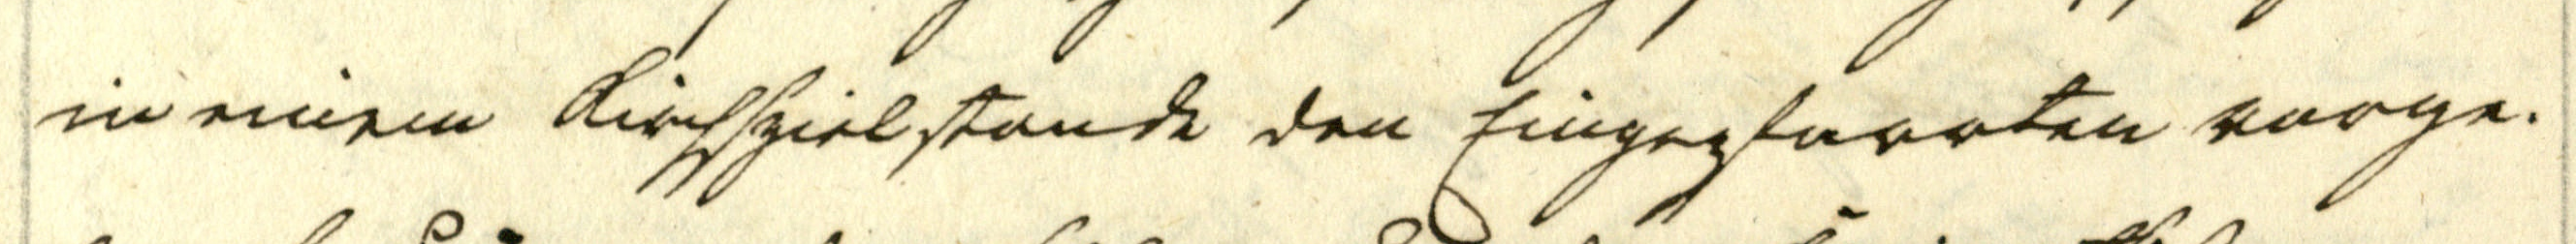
in einem Kirchspielstande den Eingepfarrten vorge¬
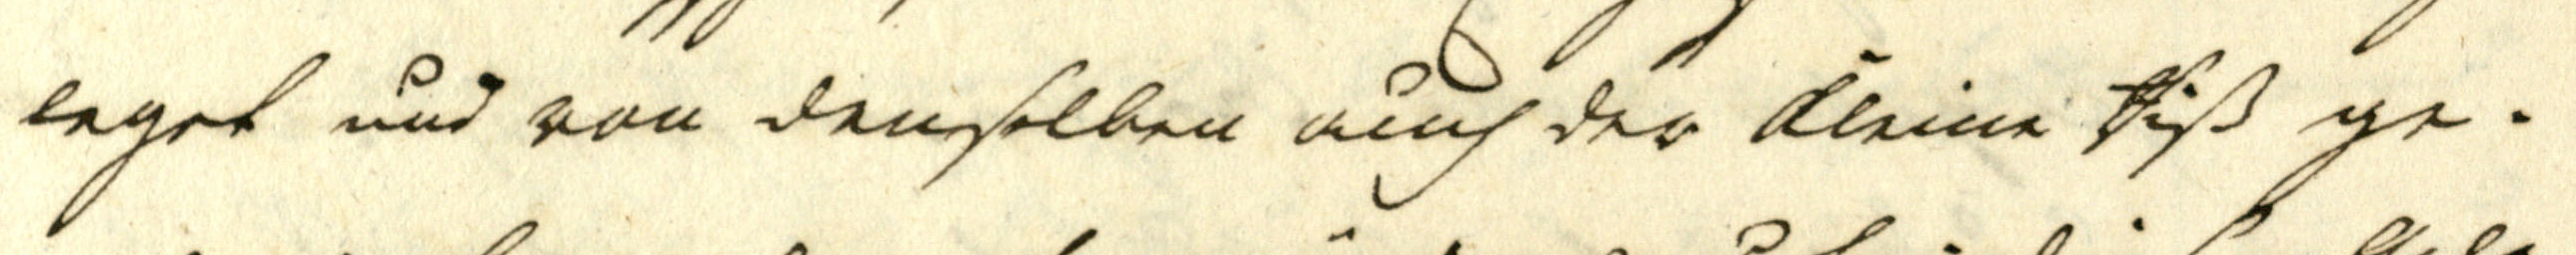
leget und von denselben auch der kleine Riß ge¬
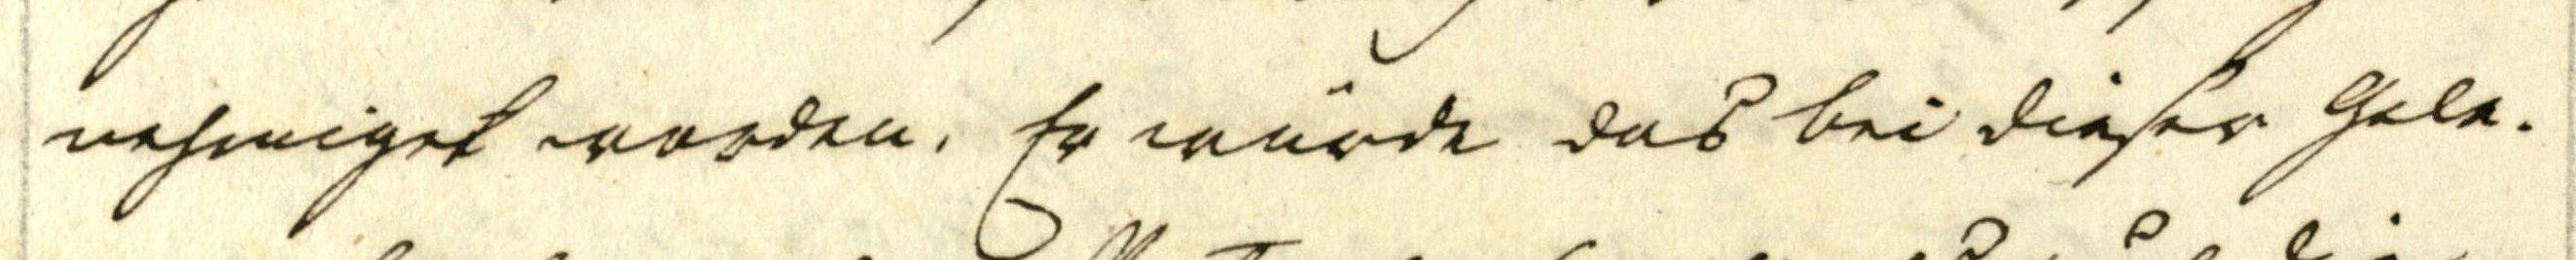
nehmiget worden. Er würde das bei dieser Gele¬
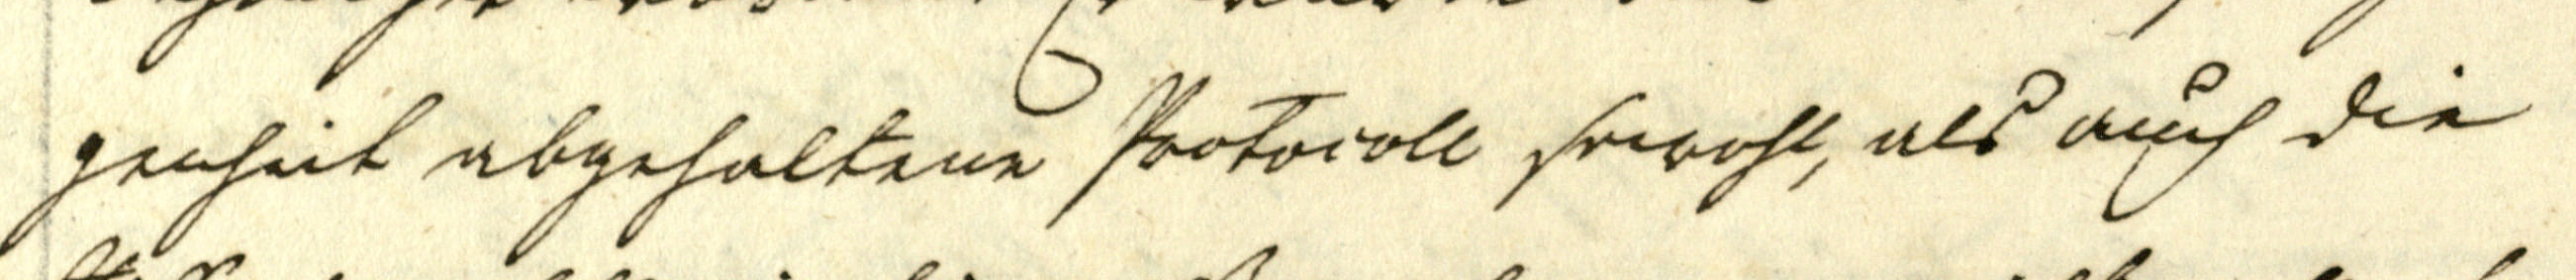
genheit abgehaltene Protocoll sowohl, als auch die
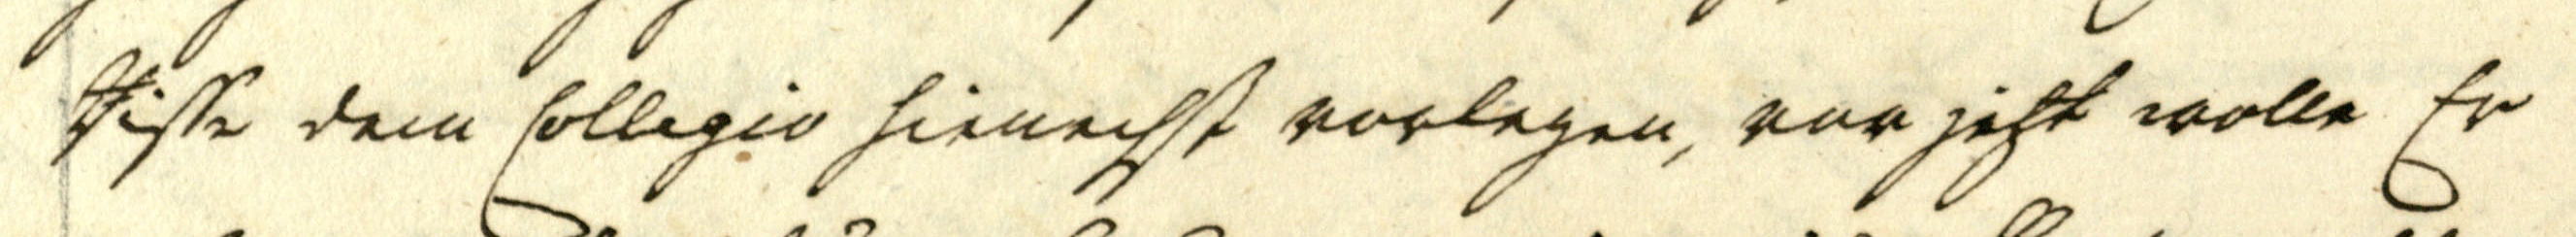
Risse dem Collegio hienechst vorlegen, vor jetzt wolle Er
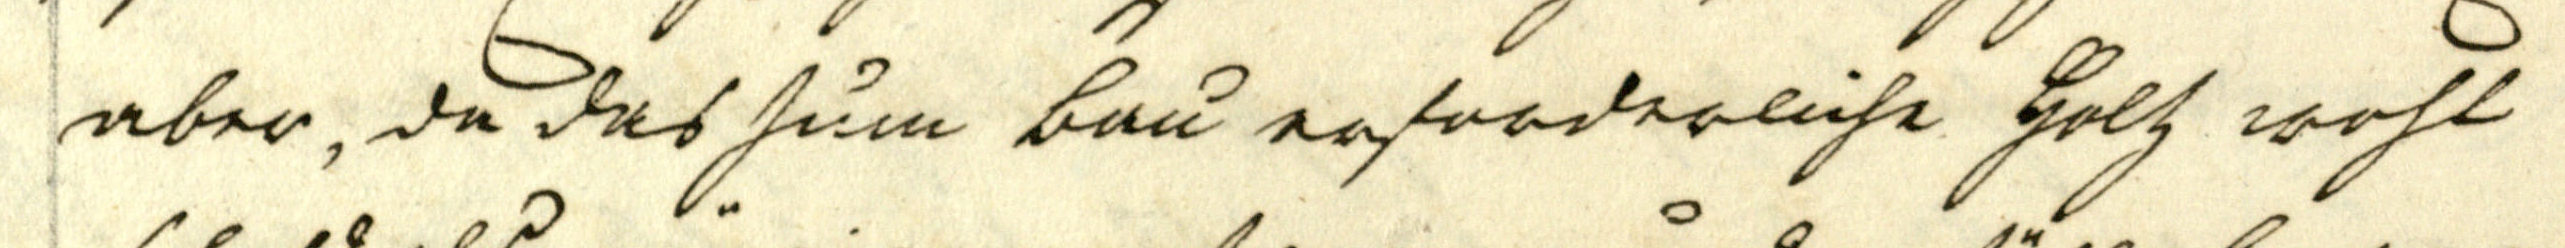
aber, da das zum Bau erforderlichen Holz wohl
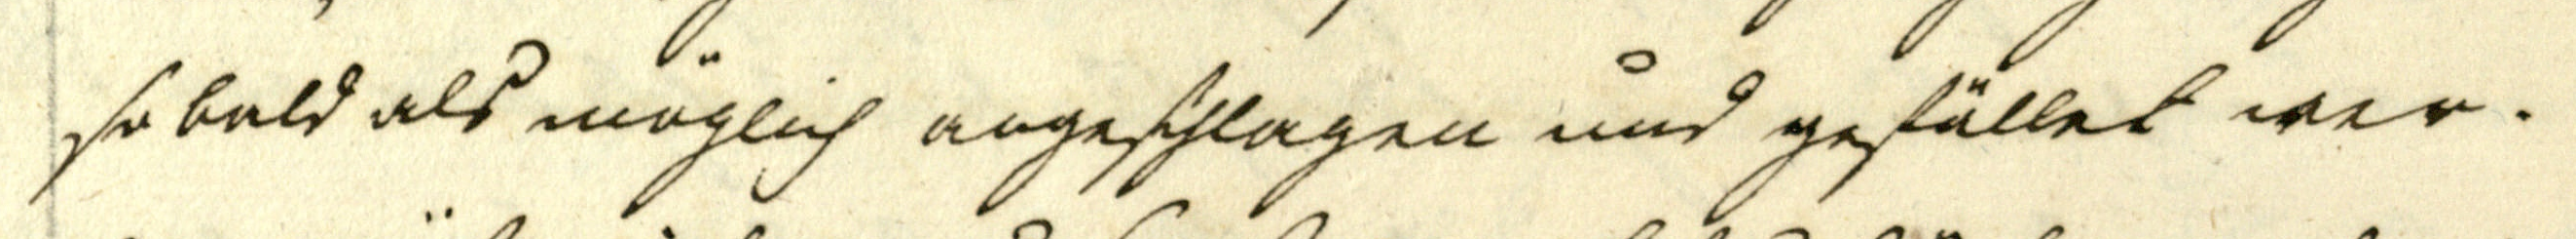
so bald als möglich angeschlagen und gefället wer¬
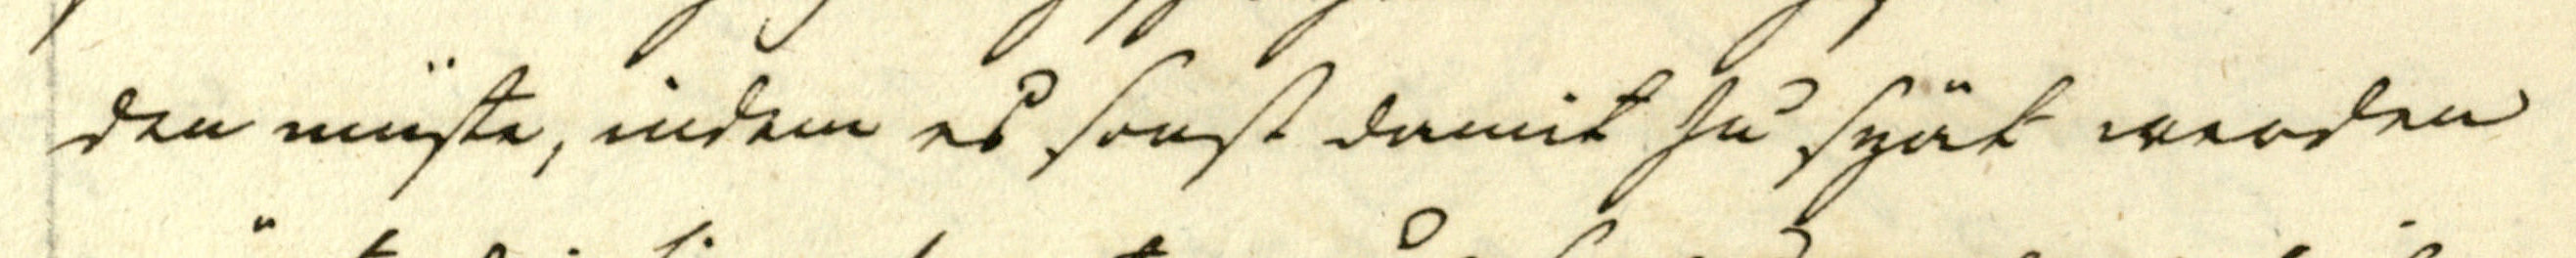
den müßte, indem es sonst damit zu spät werden
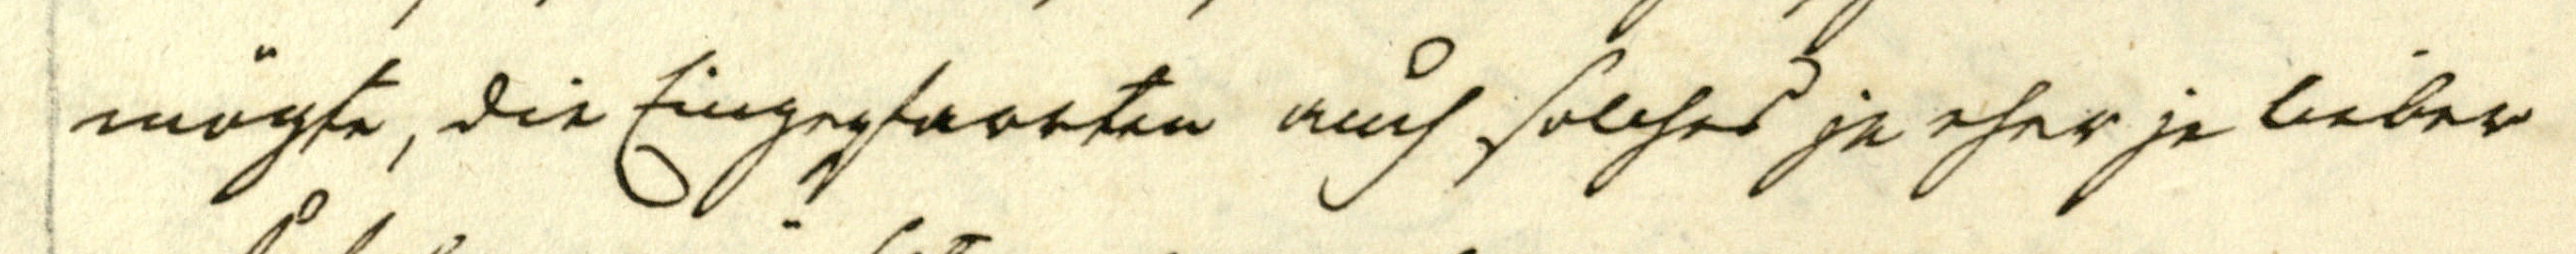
mögte, die Eingepfarrten auch solches je eher je lieber
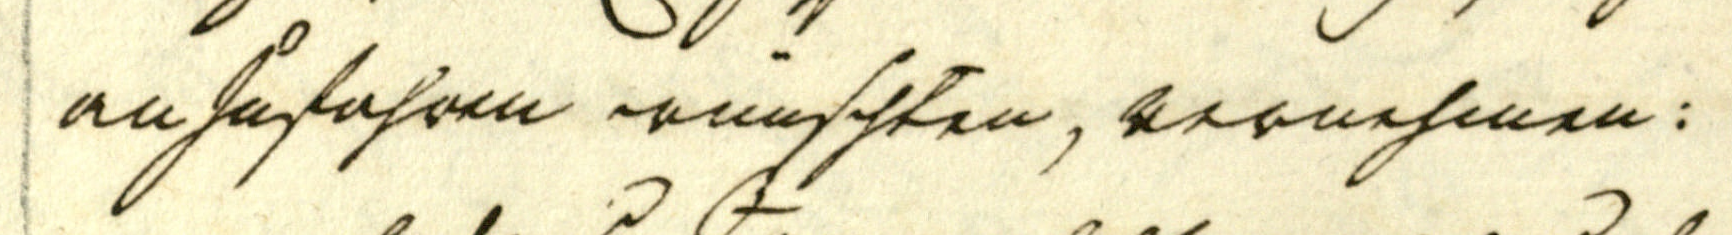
anzufahren wünschten, vernehmen:
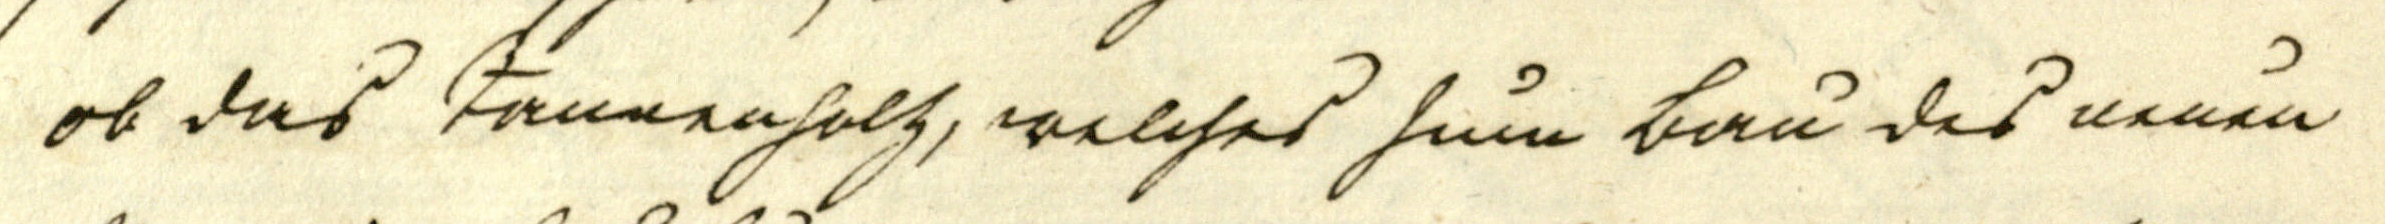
ob das Tannenholz, welches zum Bau des neuen
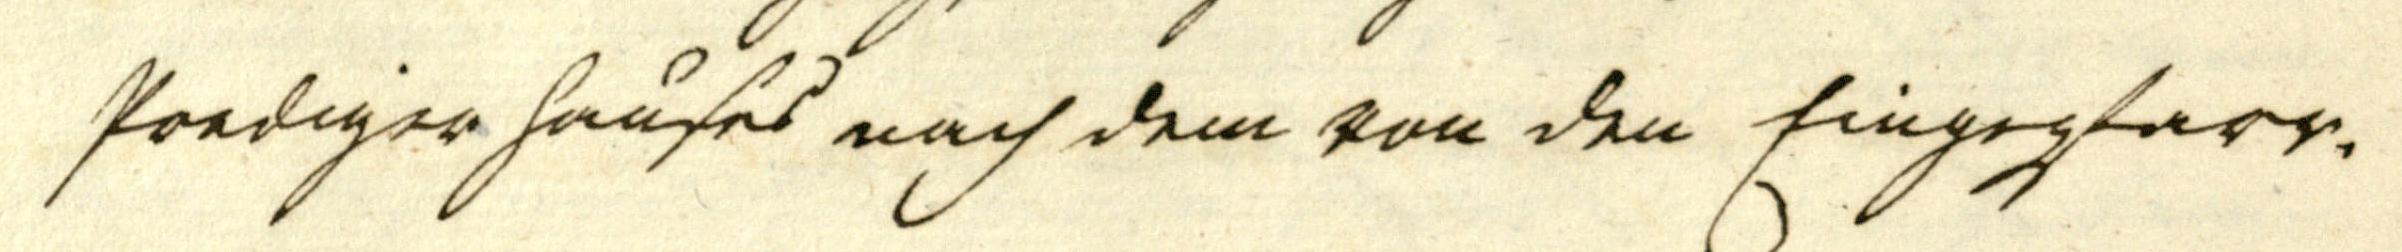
Prediger Hauses nach dem von den Eingepfarr¬
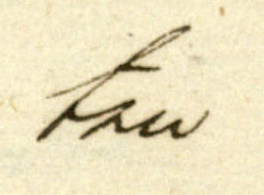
ten
